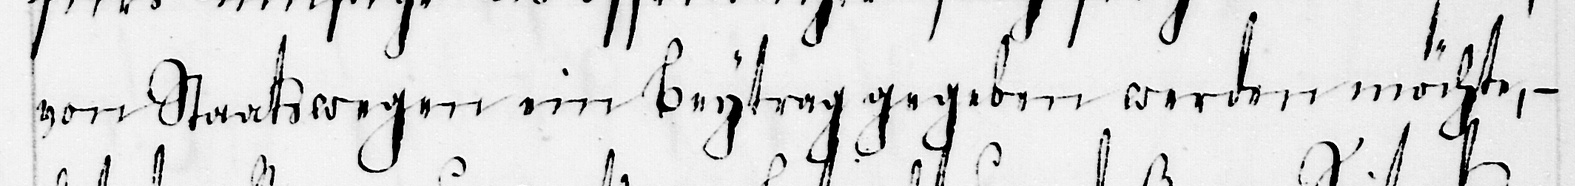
von Staatswegen ein Beytrag gegeben werden möchte, –
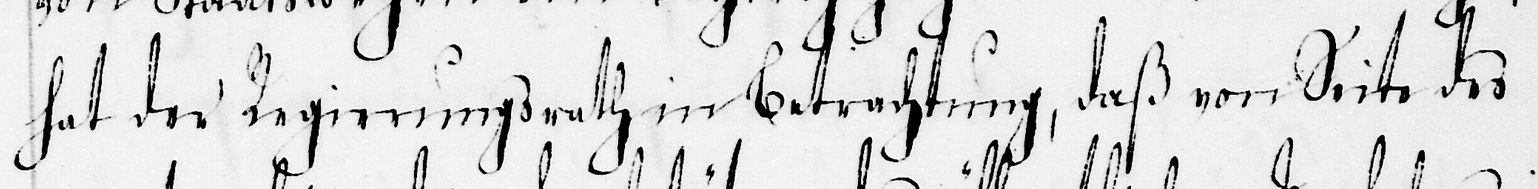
hat der Regierungsrath in Betrachtung, daß von Seite des
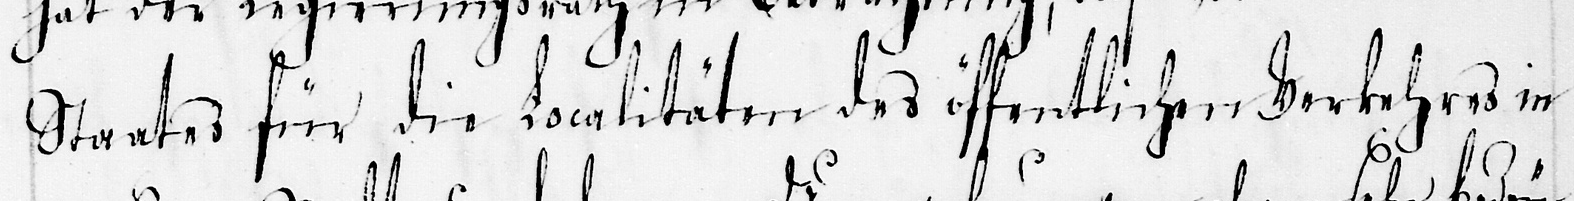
Staates für die Localitäten des öffentlichen Verkehres in
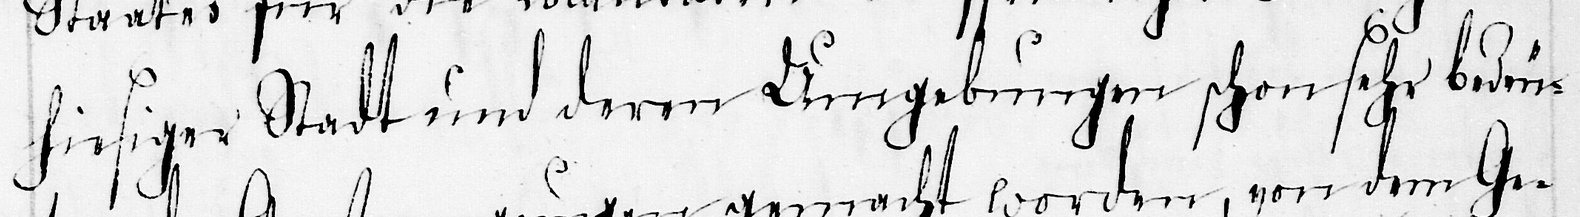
hiesiger Stadt und deren Umgebungen schon sehr bedeu¬
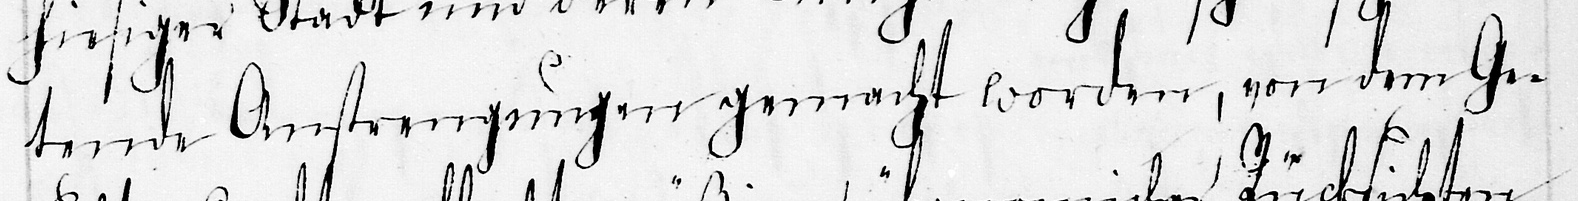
tende Anstrengungen gemacht worden, von dem Ge¬
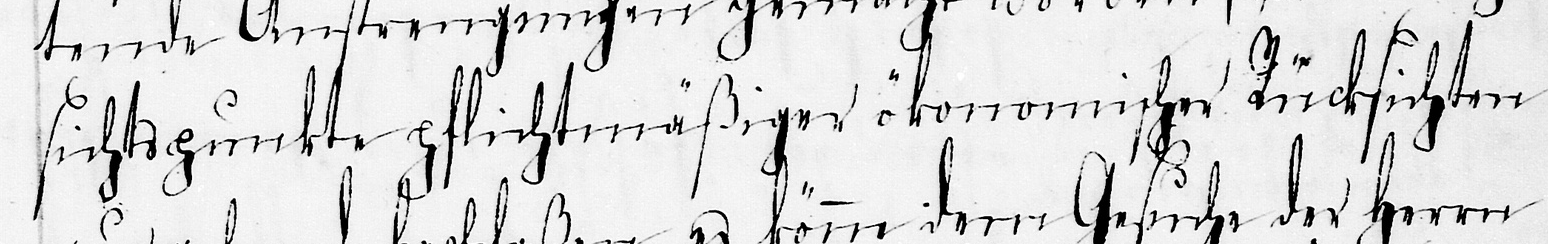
sichtspunkte pflichtmäßiger ökonomischer Rücksichten
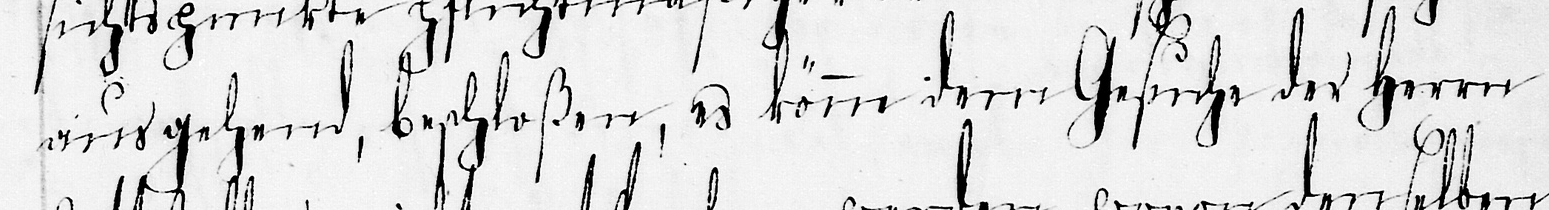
ausgehend, beschloßen, es könne dem Gesuche der Herrn
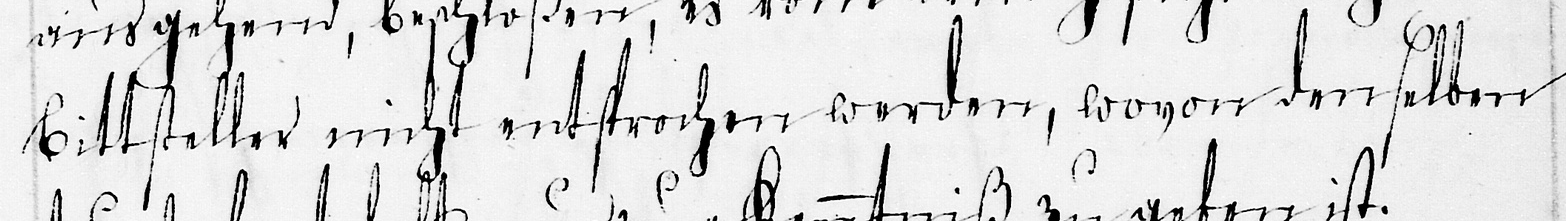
Bittsteller nicht entsprochen werden, wovon denselben
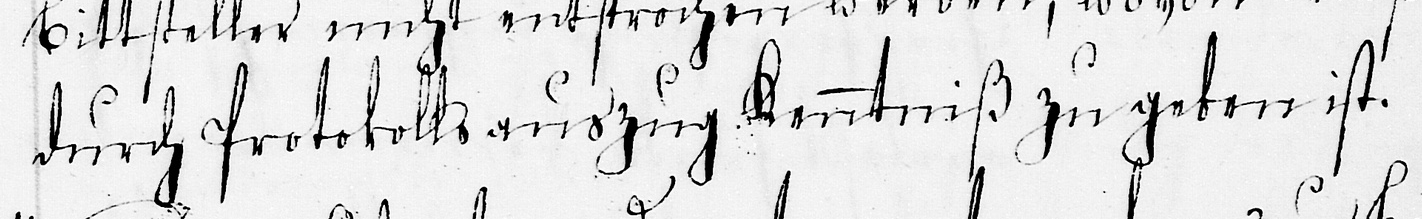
durch Protokollsauszug Kenntniß zu geben ist.
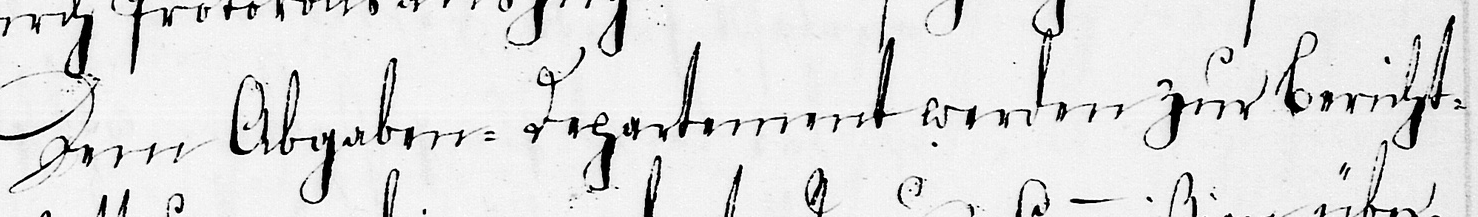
Dem Abgaben-Departement werden zur Bericht¬
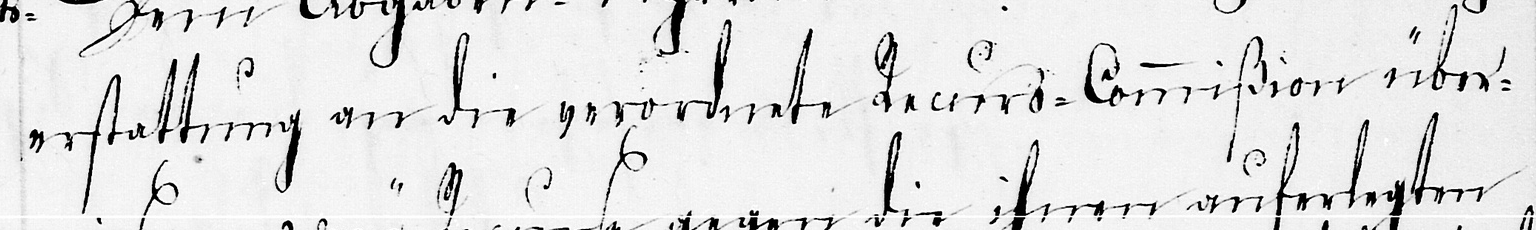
erstattung an die verordnete Recurs-Commißion über¬
